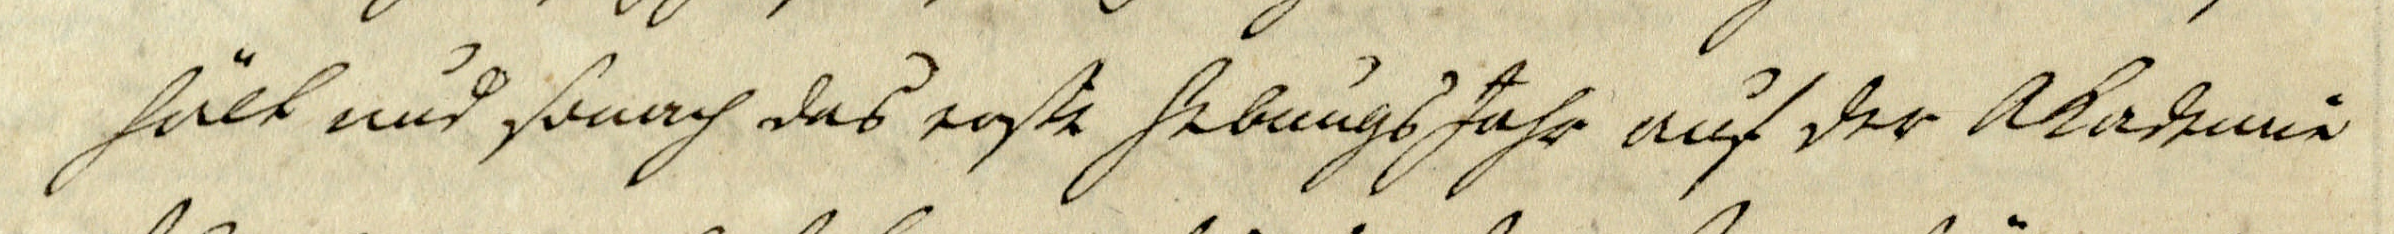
hält und sonach das erste Hebungs Jahr auf der Akademie
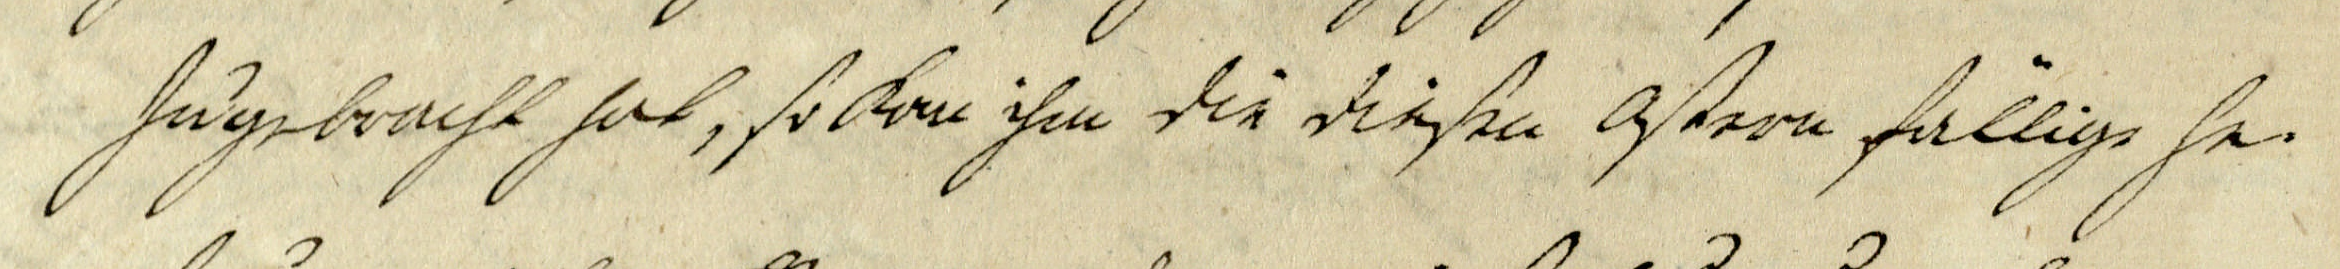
zugebracht hat, so kan ihm die diesen Ostern fällige He¬
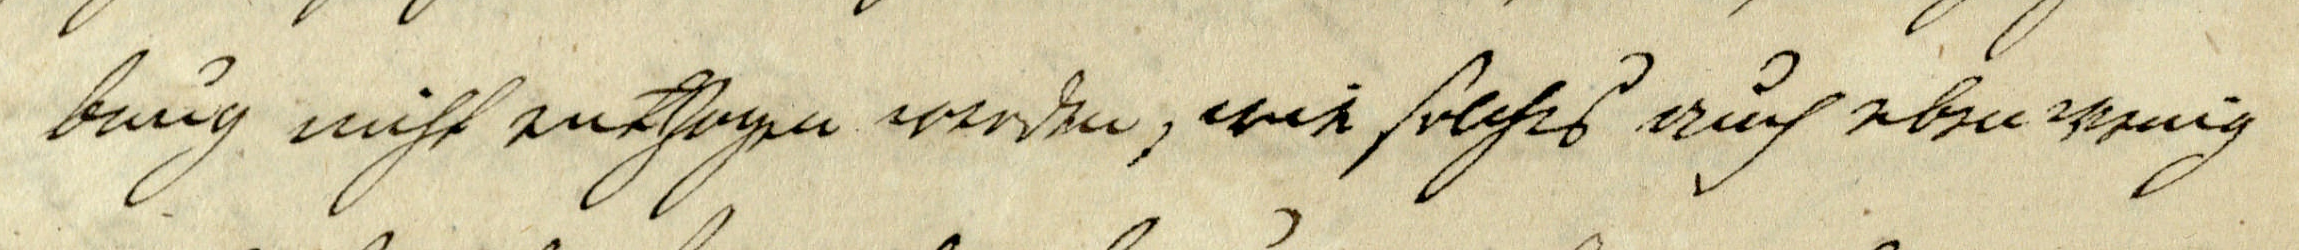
bung nicht entzogen werden, wie solches auch eben wenig
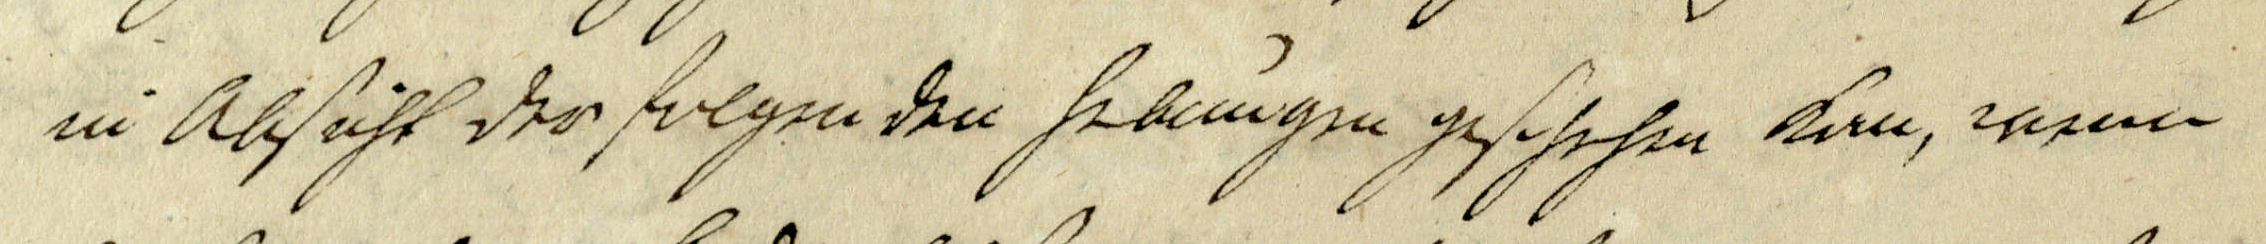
in Absicht der folgenden Hebungen geschehen kan, wenn
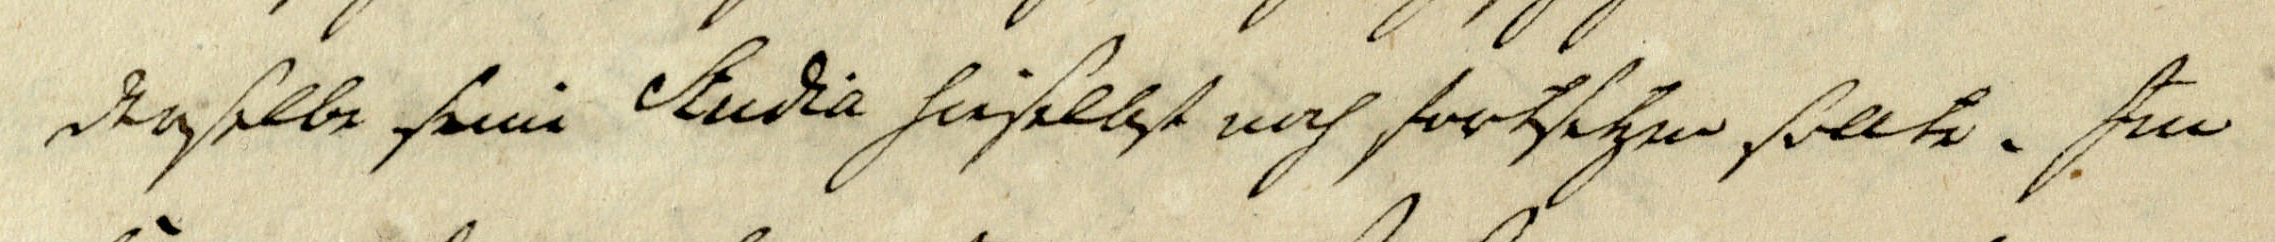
derselbe seine Studia hieselbst noch fortsetzen sollte. Im
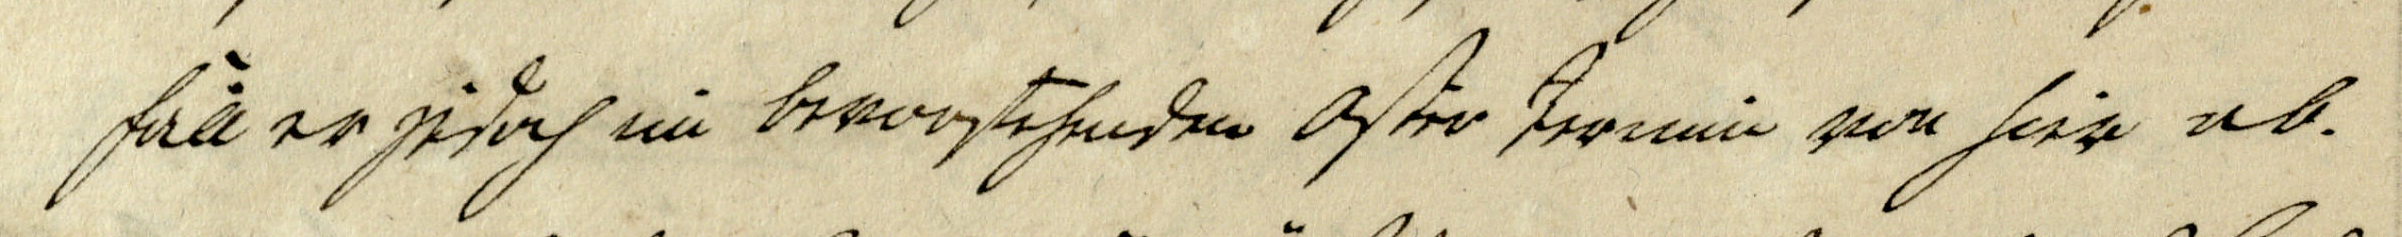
Fall er jedoch in bevorstehenden Oster Termin von hier ab¬
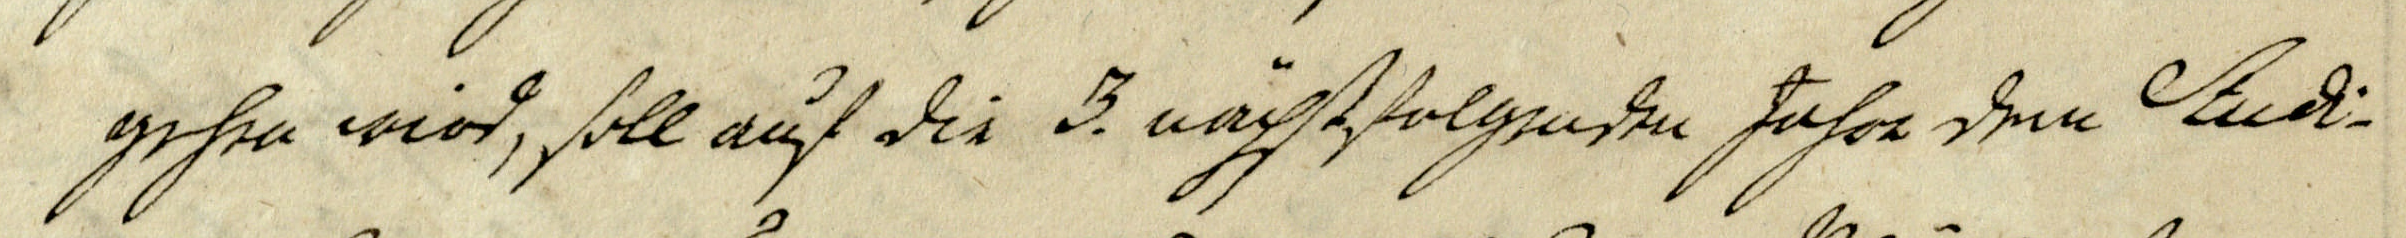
gehen wird, soll auf die 3. nächstfolgenden Jahre dem Studi¬
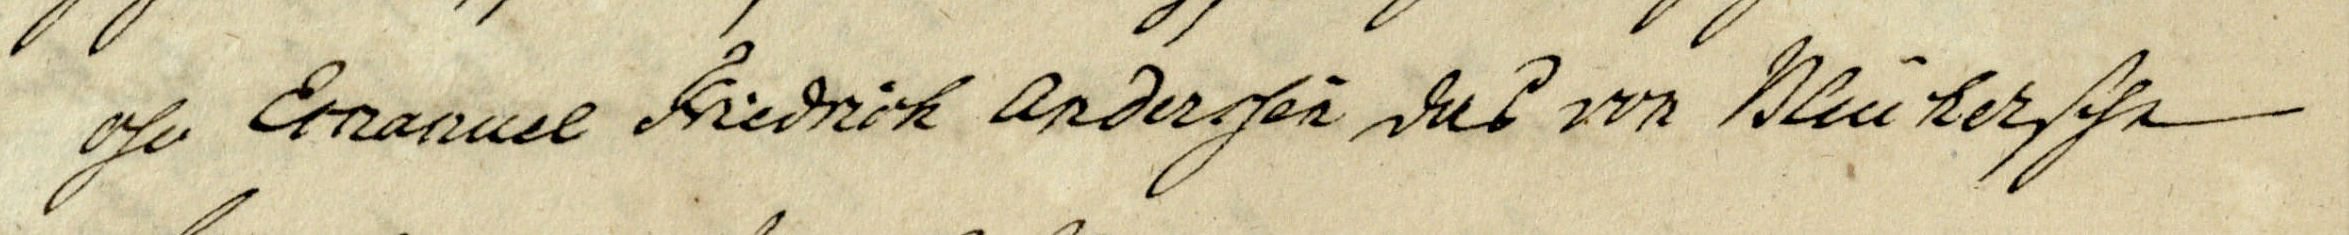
oso Emanuel Friedrich Anderssen das von Blüchersche
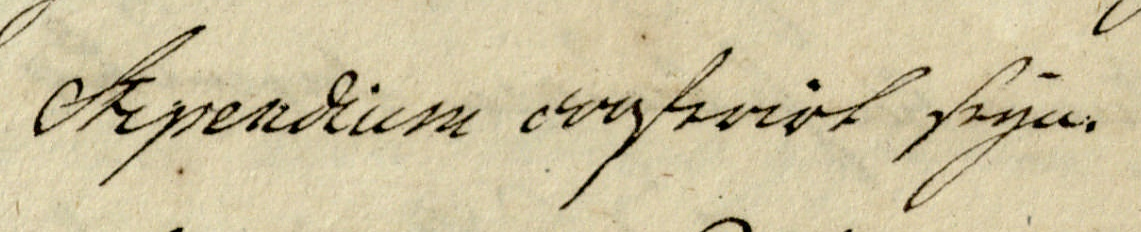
Stipendium conferirt seÿn.
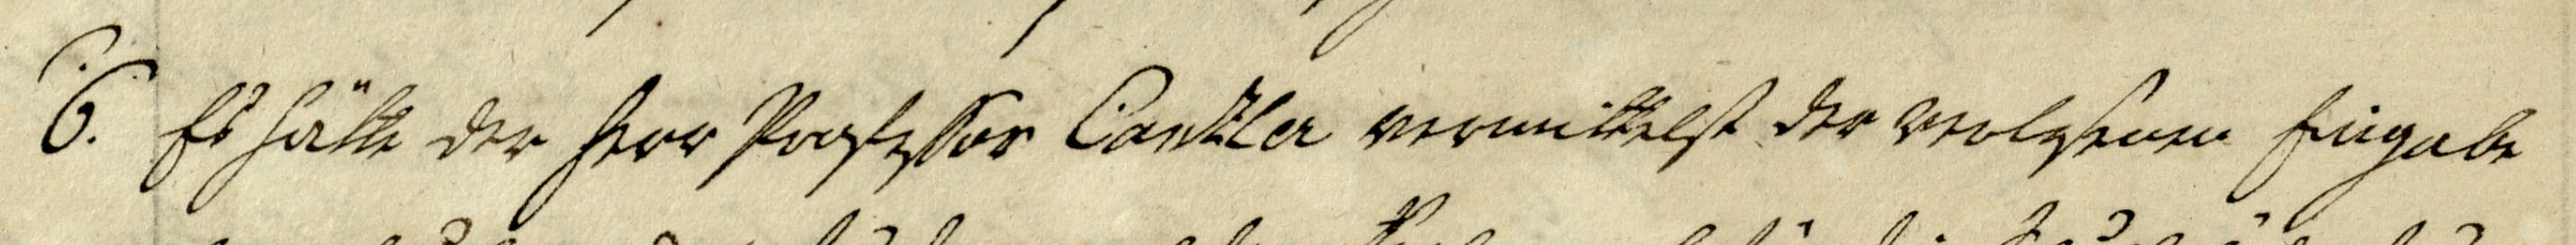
6. Es hätte der Herr Professor Canzler vermittelst der verlesenen Eingabe
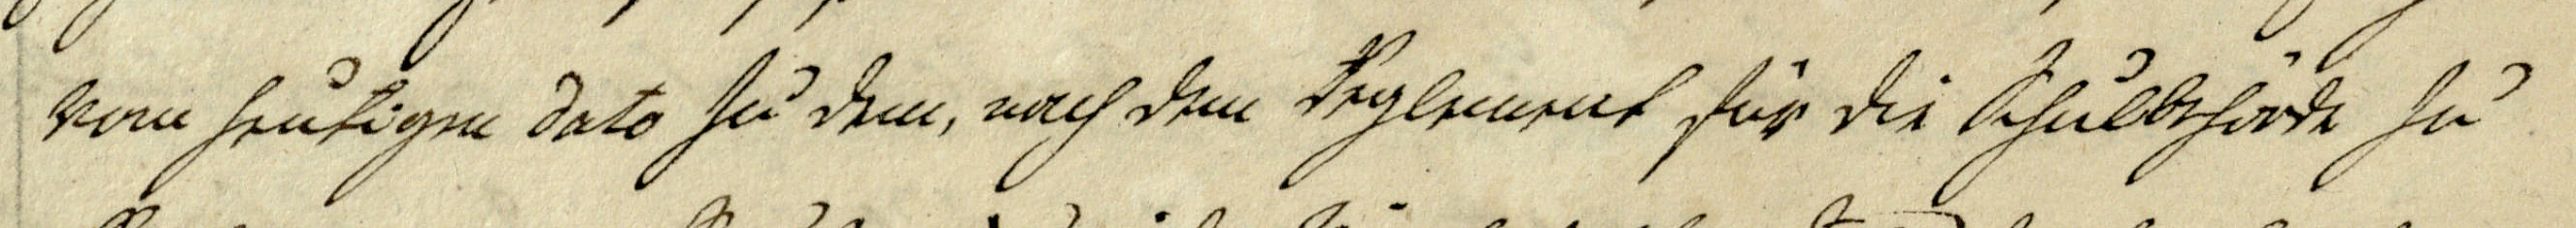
vom heutigen dato zu dem, nach dem Reglement für die Schulbehörde zu
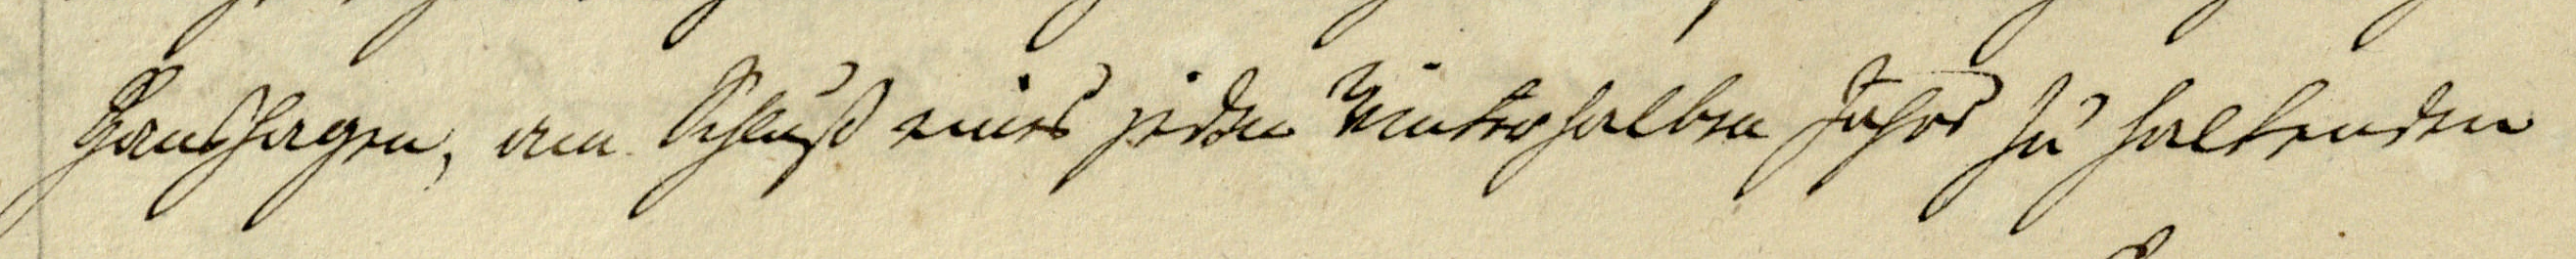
Hanshagen, am Schluß eines jeden Winterhalben Jahrs zu haltenden
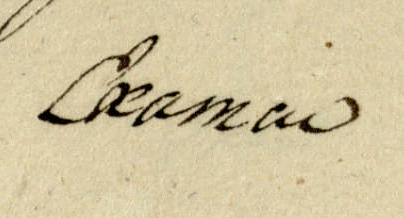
Examen
